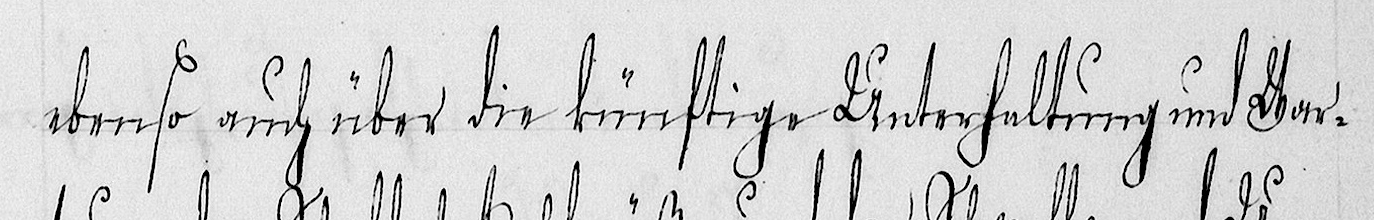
ebenso auch über die künftige Unterhaltung und War¬
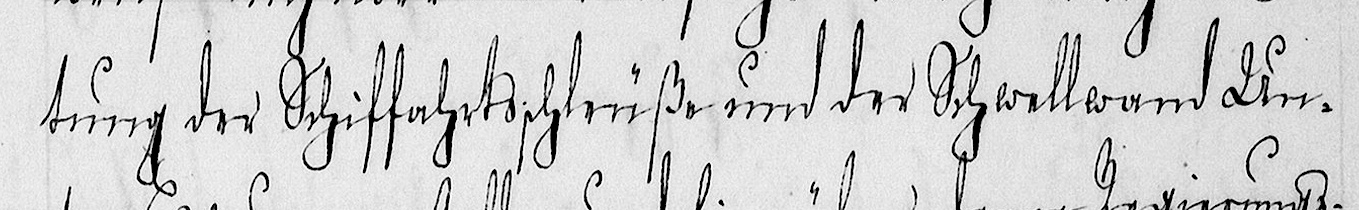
tung der Schiffahrtsschleuße und der Schwellwand Un¬
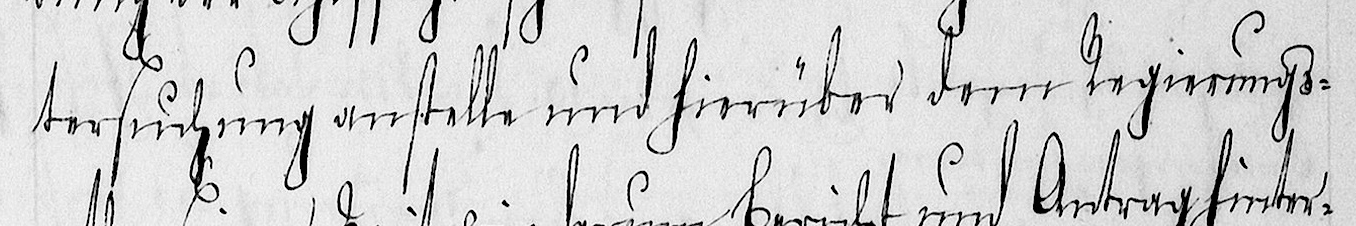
tersuchung anstelle und hierüber dem Regierungs¬
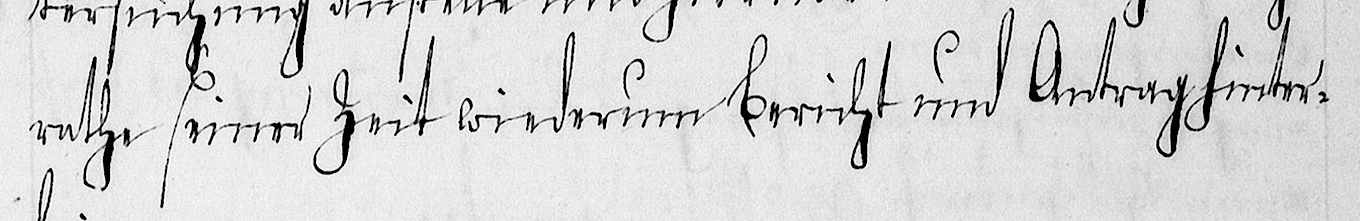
rathe seiner Zeit wiederum Bericht und Antrag hinter¬
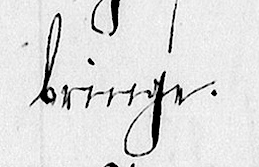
bringe.
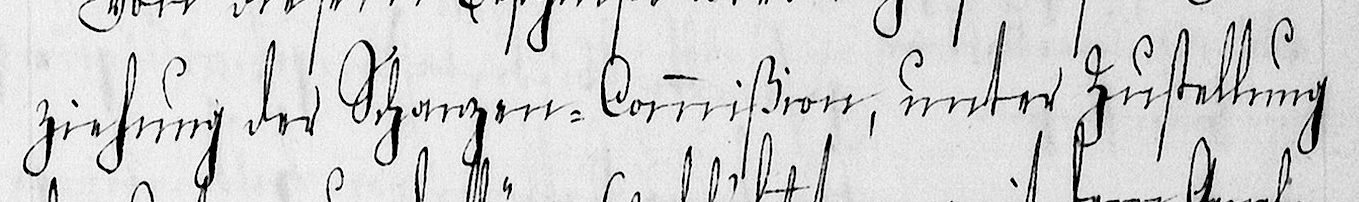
ziehung der Schanzen-Commißion, unter Zustellung
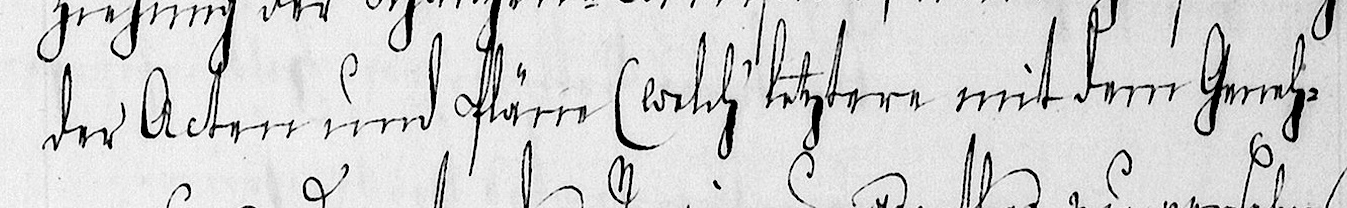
der Acten und Pläne (welch’ letztere mit dem Geneh¬
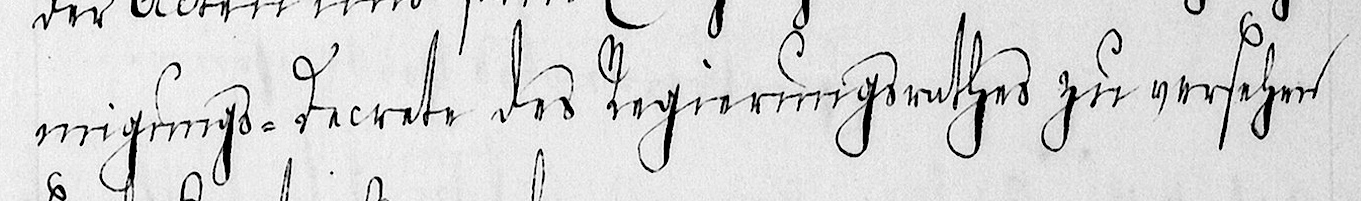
migungs-Decrete des Regierungsrathes zu versehen
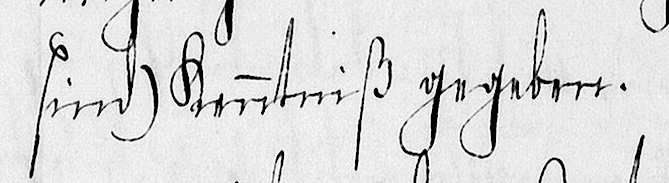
sind) Kenntniß gegeben.
